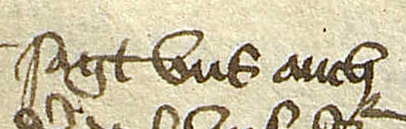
ſagt vns auch
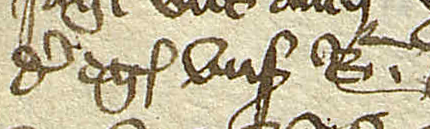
d* eg* vnſ* B* .
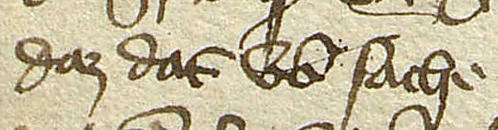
daʒ das vo* ſache
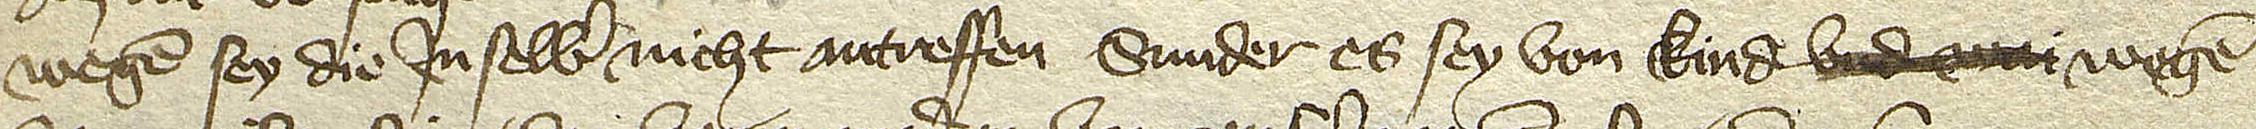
wege ſey die In ſelb* nicht antreffen Sunder es ſey von kind vnd wai wege*
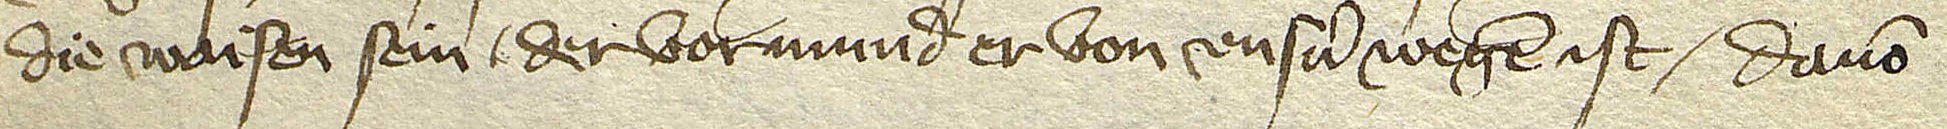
die waiſen ſein / der vormund er von vnſn* wege* iſt / dauo*
